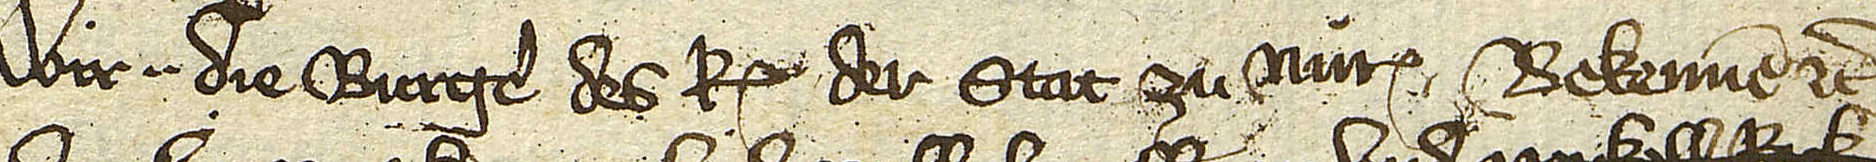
Wir ~ die Burge* des R* der Stat cʒu Nür* / Bekenne* ec*
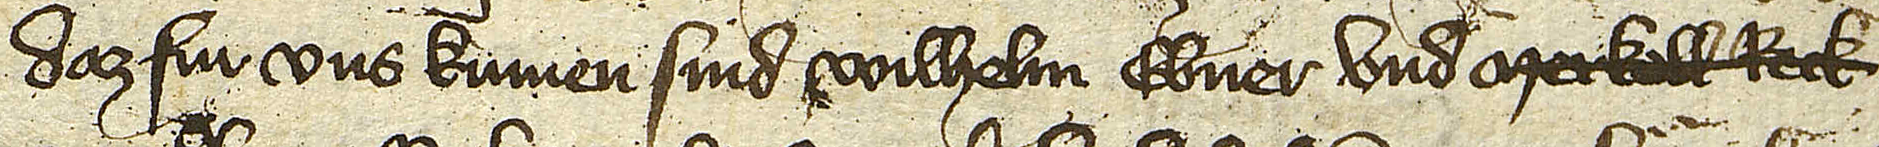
daʒ für vns kumen ſind wilhelm Ebner vnd Merkell Reck
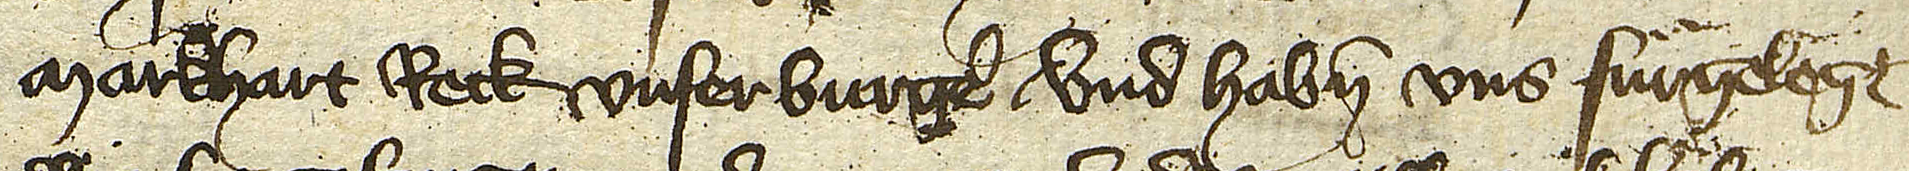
Markhart Reck vnſer burge* / vnd habn* vns fürgelegt
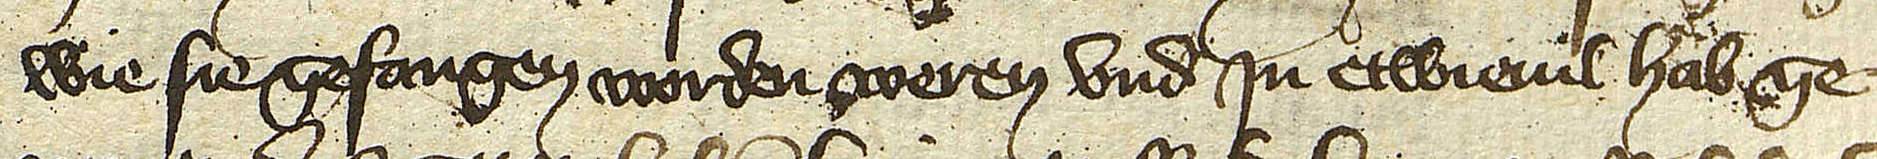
wie ſie gefangen worden weren vnd In etwieuil hab ge =
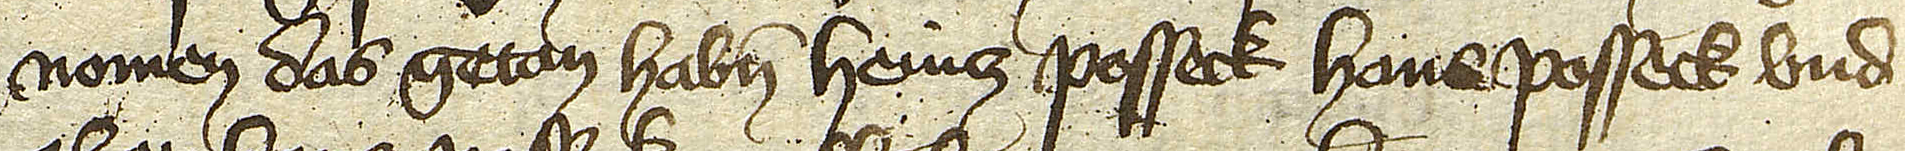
nomen das getan habn* heincʒ poſſeck hans poſſeck vnd
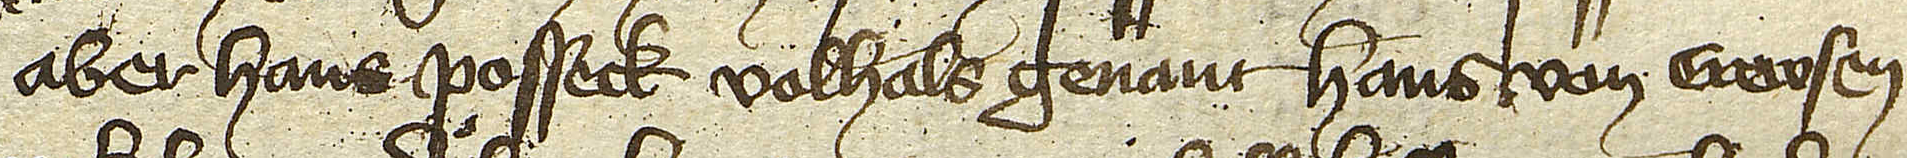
aber hans poſſeck volhals genant hans von Grewſen
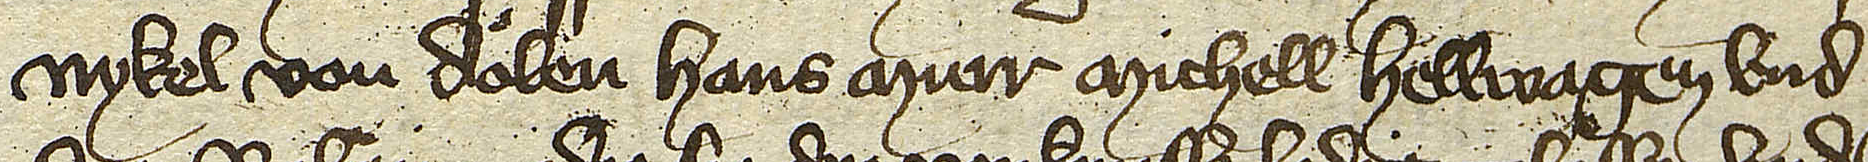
Nykel von dölen hans Murr Michell hellwagen vnd
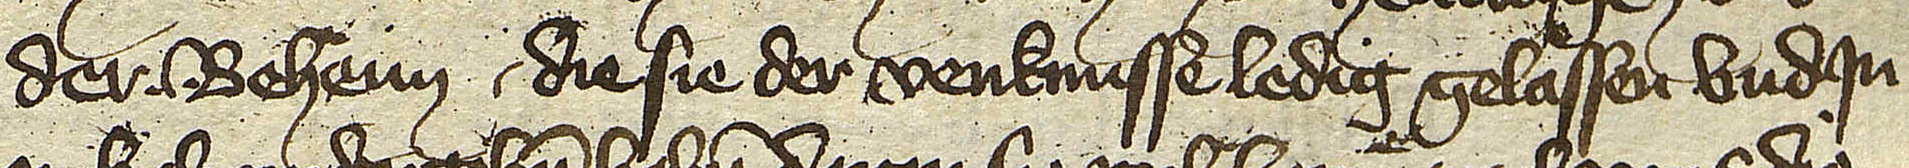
der ~nBeheim / die ſie der venknuſſe ledig gelaſſen vnd In
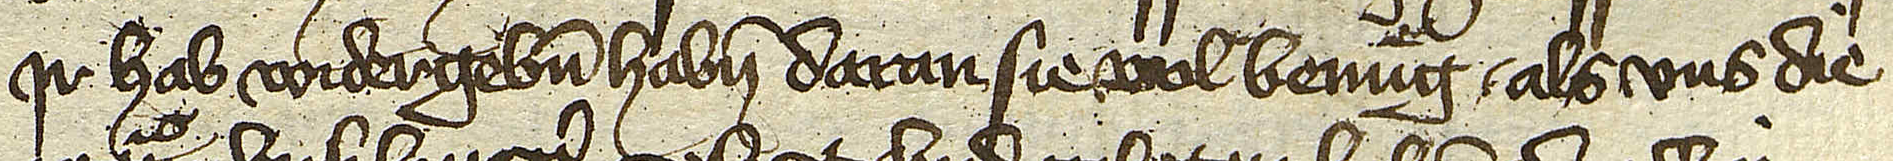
Ir hab widergebn* habn* daran ſie wol benüg / als vns die
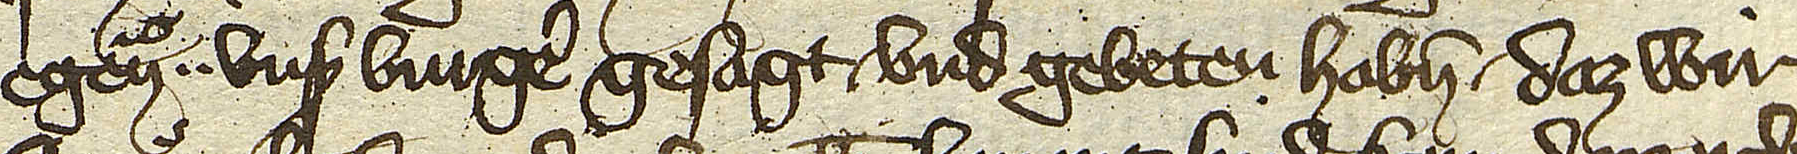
egen* ~ vnſ* burge* geſagt / vnd gebeten habn* / daʒ wir
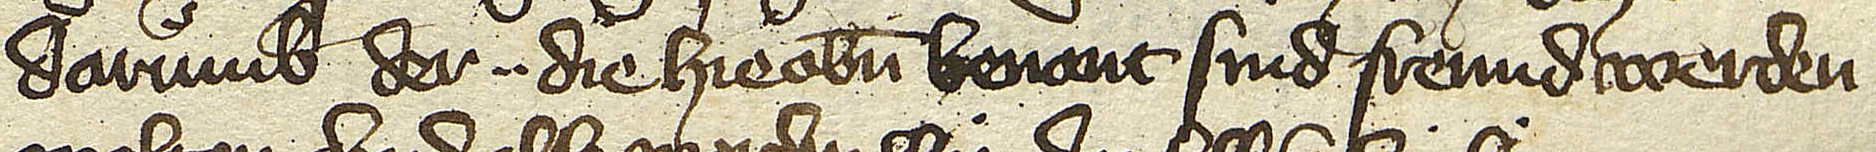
darümb der ~ die hie obn* benant ſind freund werden
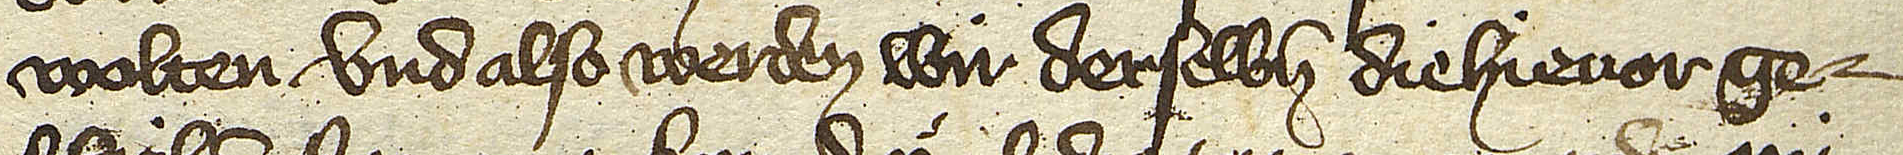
wolten / vnd alſo werden wir derſelbn* die hieuor ge =
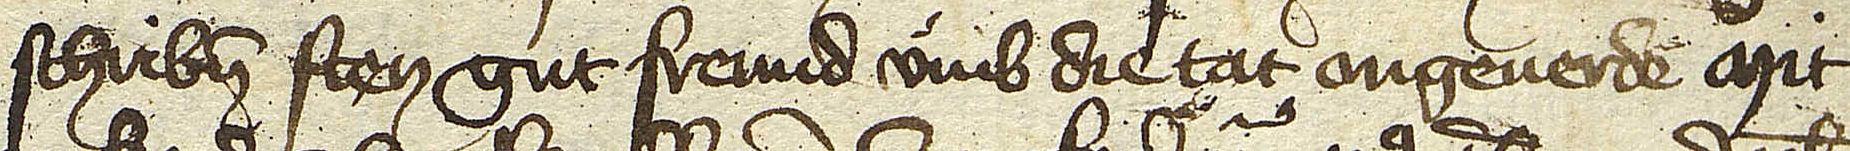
ſchribn* ſten gut freund v̈mb die tat ongeuerde Mit
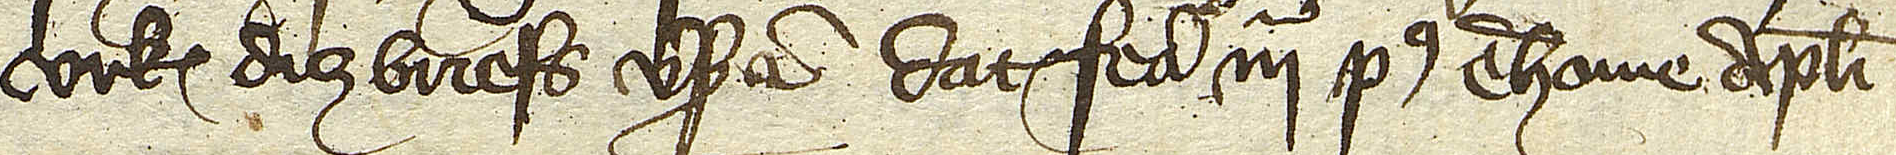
vrk* dicʒ briefs v*ſ* ec* dat* fea* iii* p* Thome Apli*
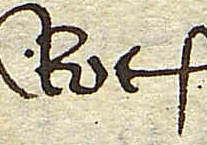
Rot*
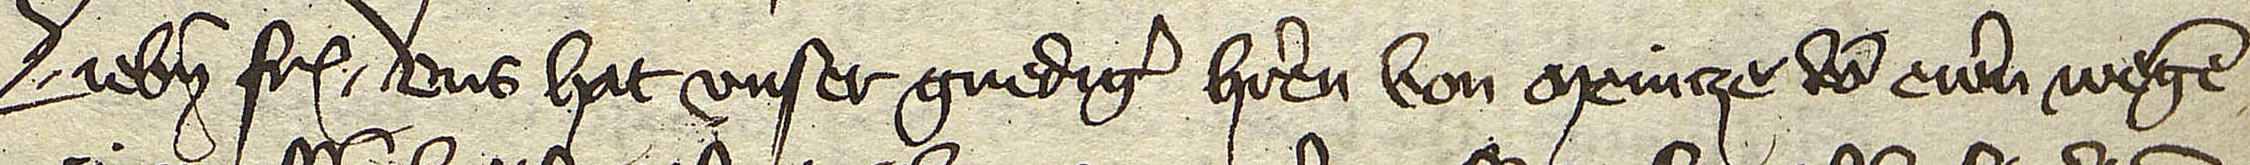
Liebn* fr* / Vns hat vnſer gnedig* hr*en von Meincʒe vo* ew*n wege*
